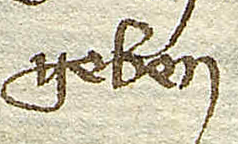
geben
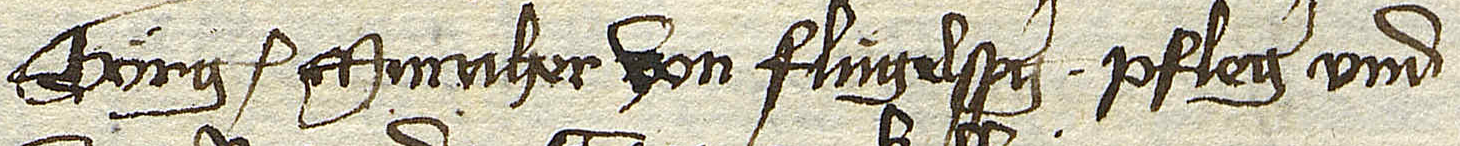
Görg* Muraher Von flügelſp*g . pfleg* vnd
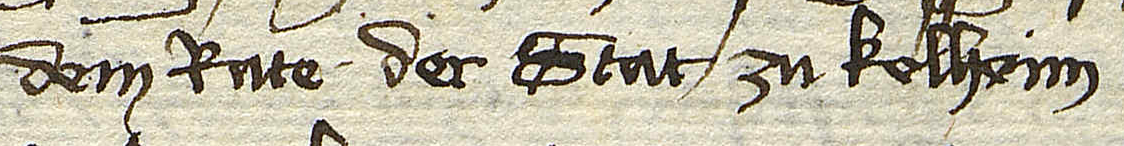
dem Rate . der Stat ʒu kelheim
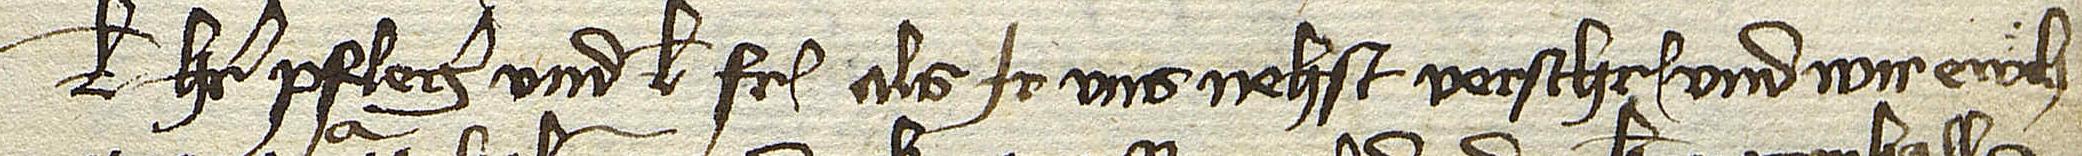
L* h*r pfleg* vnd l* fr* als Ir vns nehſt verſchr* vnd wir eẅch
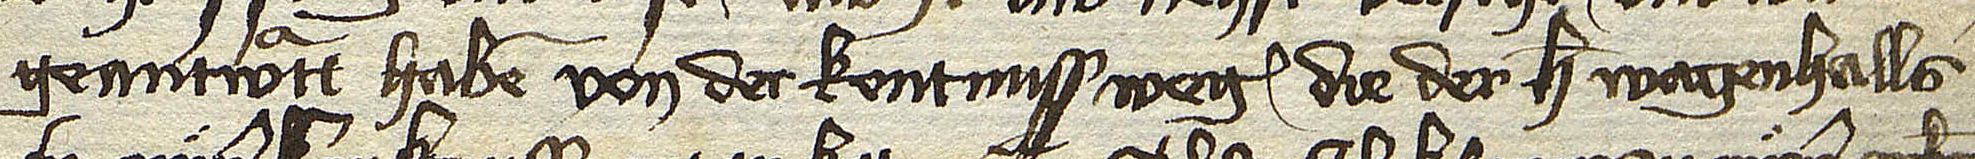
geantw*tt habe* von der kentnuſſ weg* die der h* wagenhalls
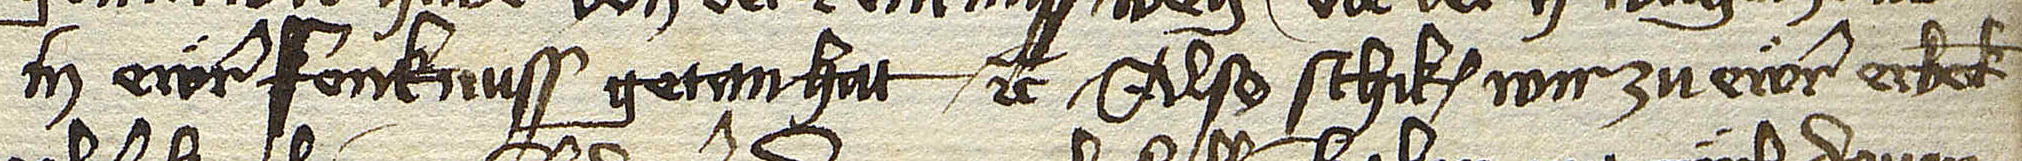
In eẅr* fenknuſſ getan hat / ec* Also ſchik* wir ʒu eẅr* erberk*
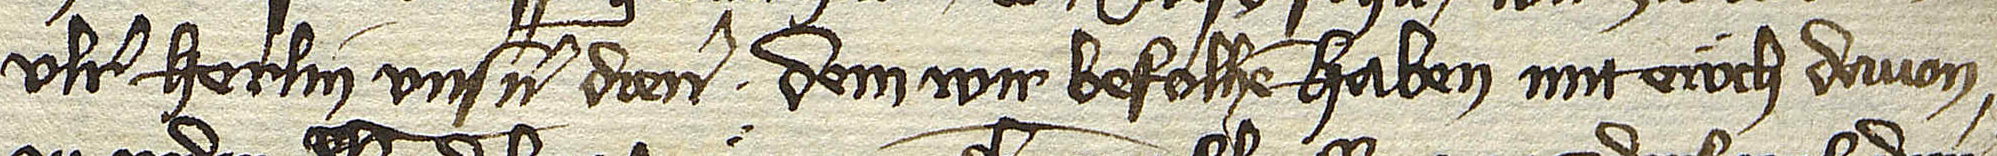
vlr* herlin vnſ*n dien* . dem wir befolhe* haben mit eẅch dauon
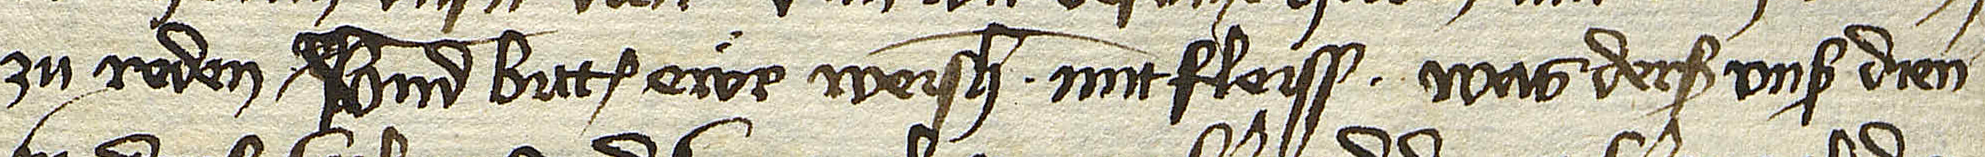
ʒu reden / Vnd bitt* eẅr weiſh* . mit fleiſſ . was derſ* vnſ* dien*
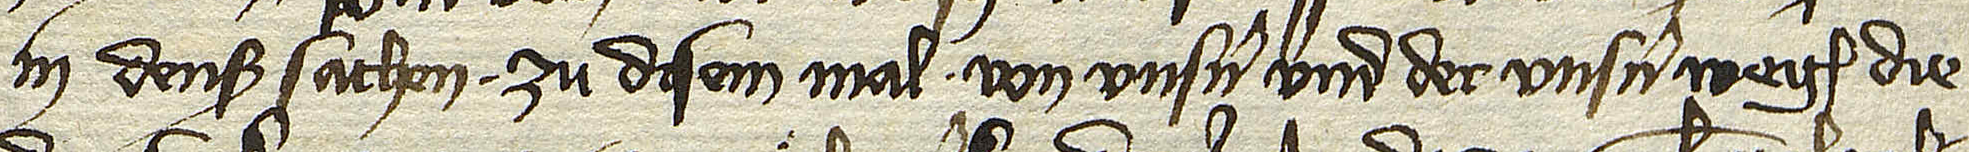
in denſ* ſachen . ʒu diſem mal . von vnſ*n vnd der vnſ*n weg* die
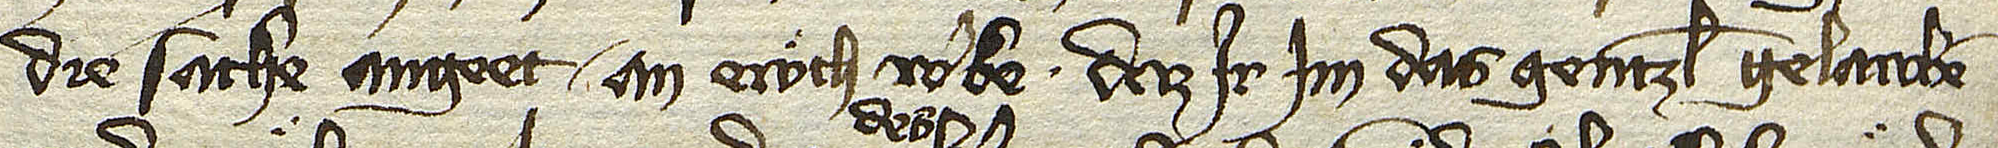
die ſache angeet / an eẅch w*be . Daʒ Ir Im das gencʒl* gelawbe*
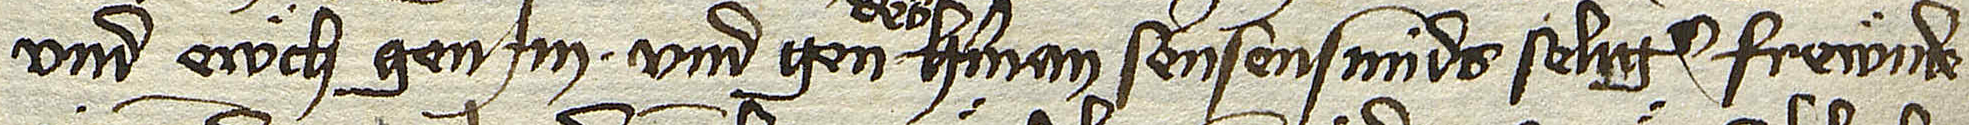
vnd eẅch gen Im . vnd gen h*man ſenſenmids ſelig* freẅnde
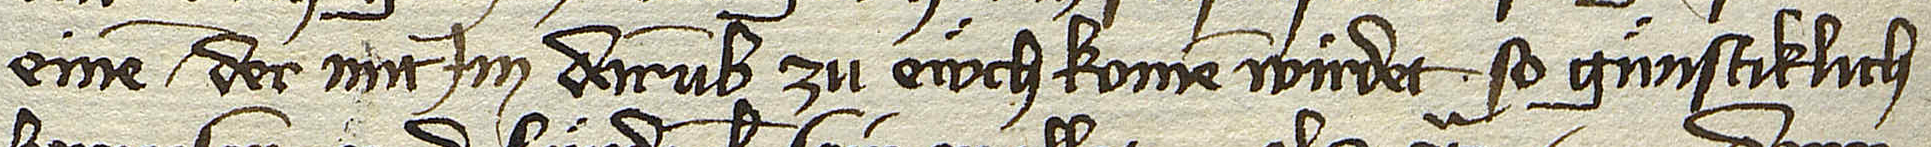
eine* / der mit Im darub* ʒu eẅch kome wirdet . ſo günſtiklich
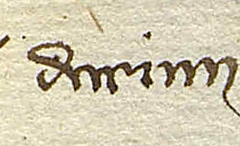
darinn
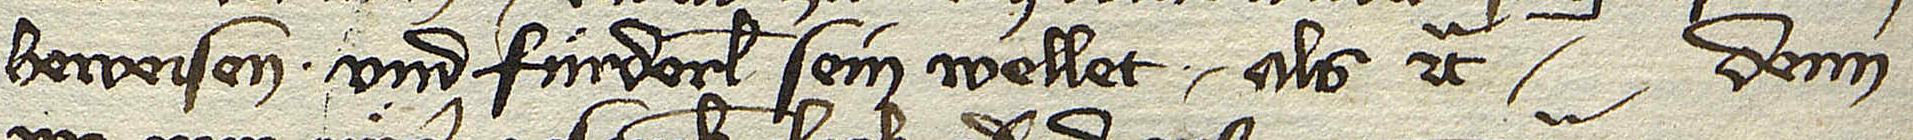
beweiſen . vnd fürderl* ſein wellet . / als ec* / Denn
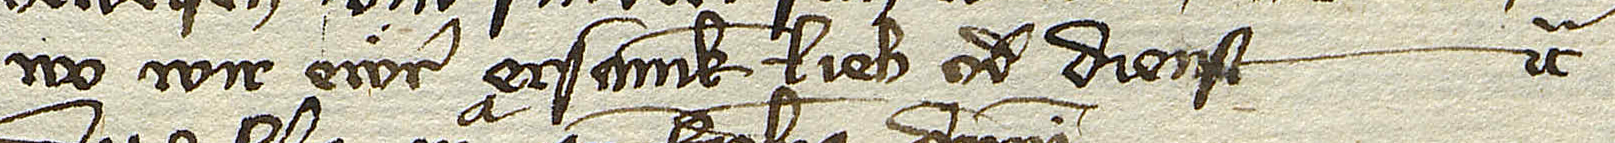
wo wir eẅr* erſamk* lieb od* dienſt ec*
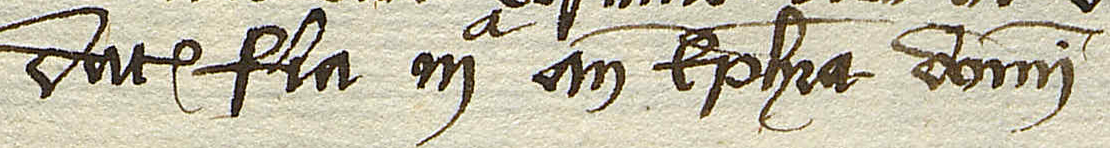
Dat* f*ia iii* an* Ephia* domi*
